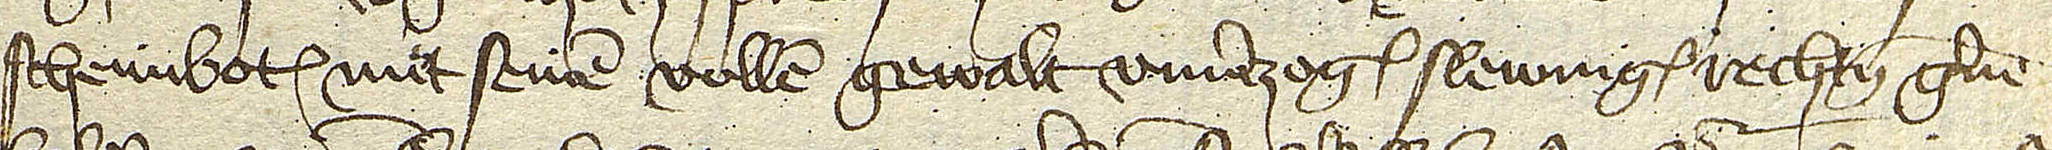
ſcheinbot* mit ſeine* volle* gewalt vnu*cʒog* ſlewnig* rechtn* g*ne
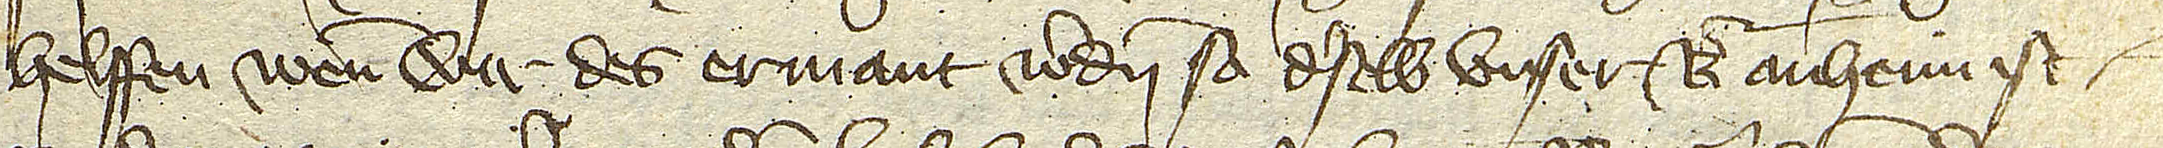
helffen wen* wir des ermant w*dn* ſo d*ſelb vnſer B* anheim iſt /
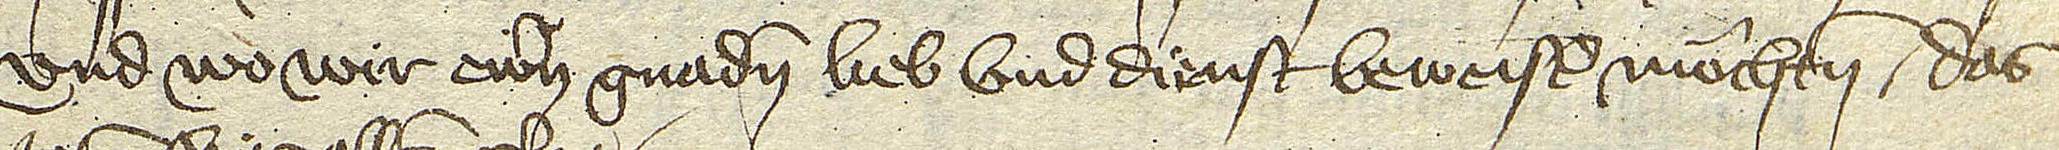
vnd wo wir ew*n gnadn* lieb vnd dienſt beweiſe* möchtn* / das
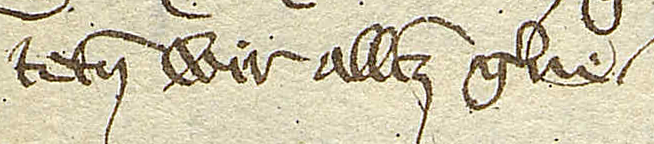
tetn* wir allcʒ* g*ne /
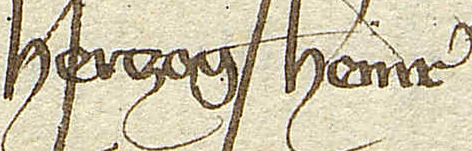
hercʒog heinr*
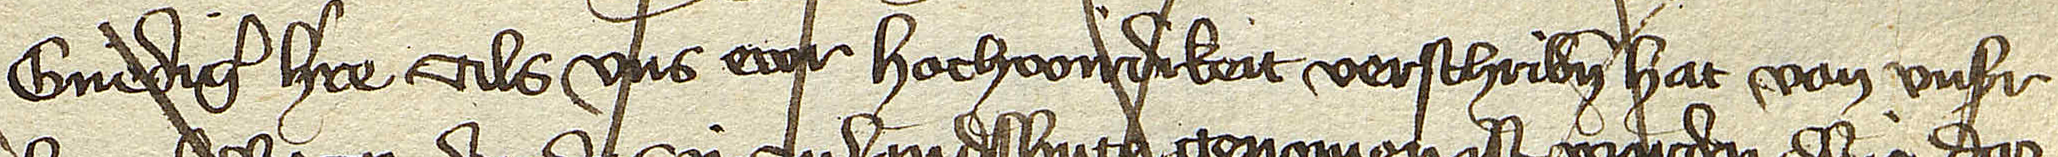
Gnedig* h*re / Als vns ewr hochwirdikeit verſchribn* hat von vnſ*r
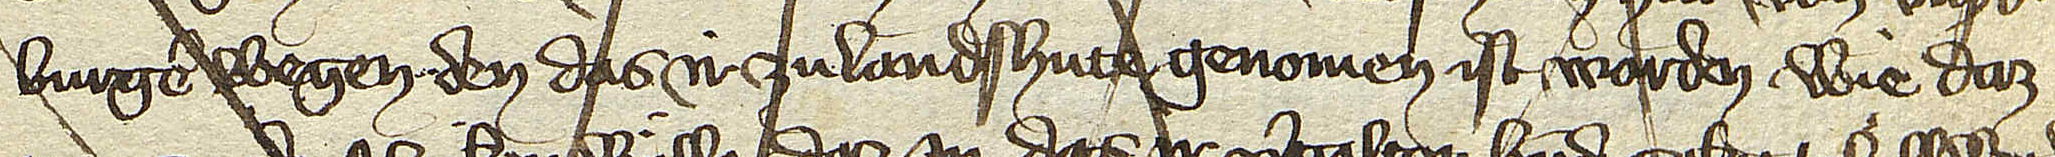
burge* wegen den das ir cʒu landſhute genomen iſt worden / wie daʒ
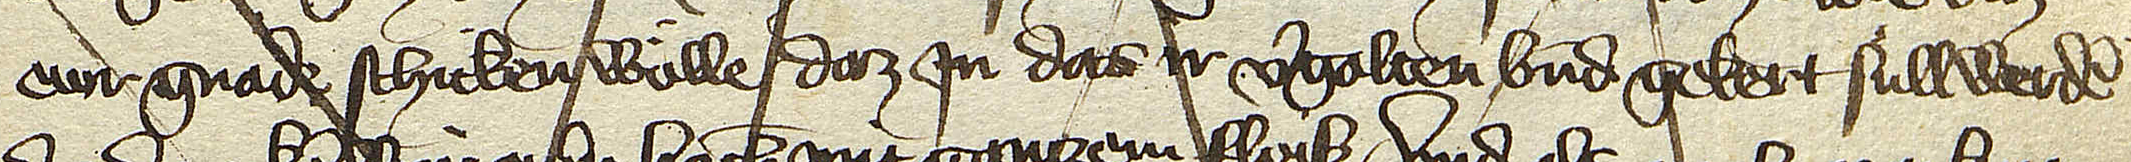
ewr gnade ſchicken wölle daʒ In das ir v*golten vnd gekert ſüll werde*
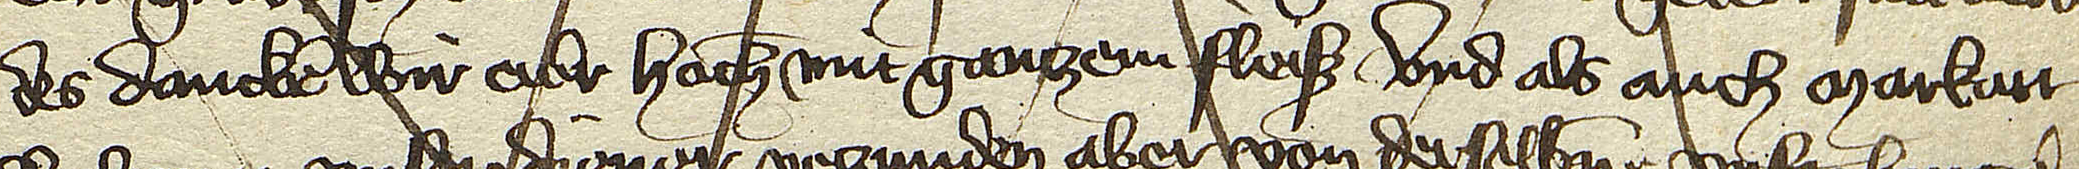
des dancke* wir ew*r hoch* mit gancʒem fleiſʒ / Vnd als auch Markart
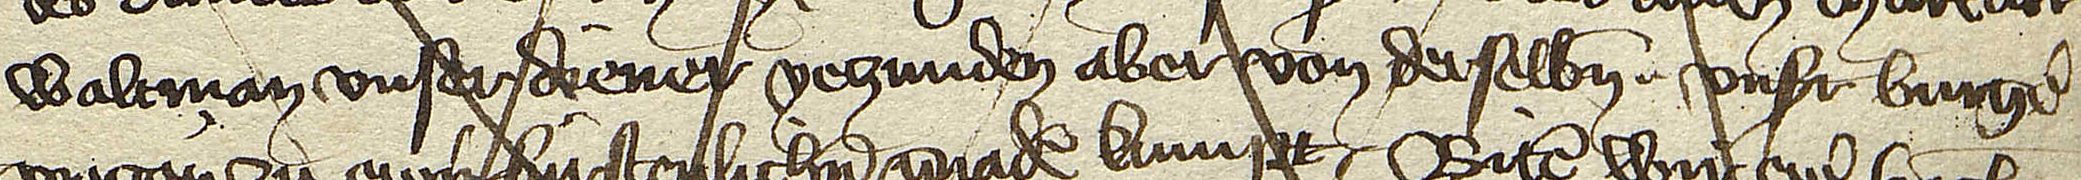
waltman vnſer diener yecʒunden aber von derſelbn* ~ vnſ*r burge*
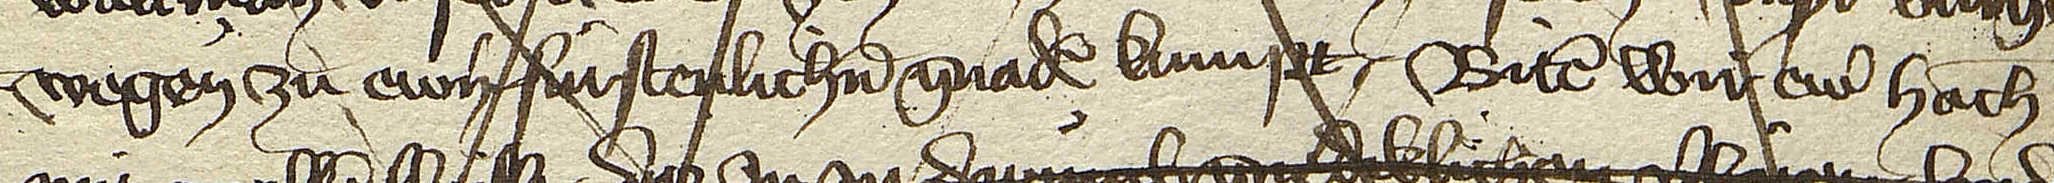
wegen cʒu ew*n fürſtenlichn* gnade* kumpt / Bite* wir ew* hoch*
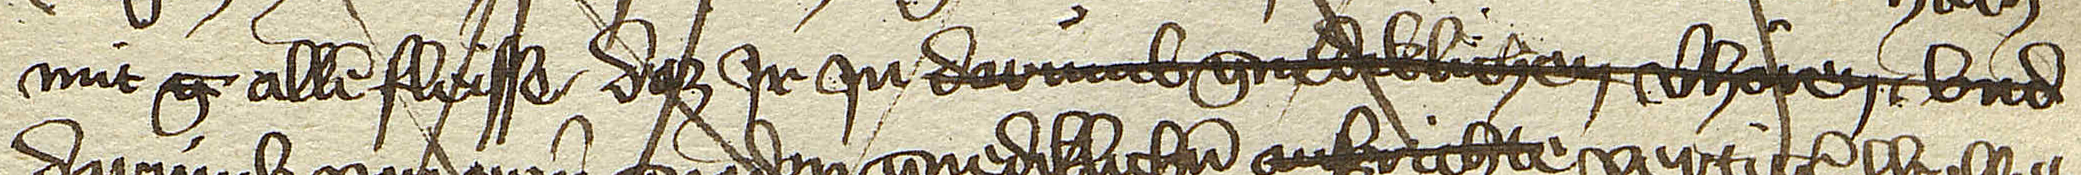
mit g alle* fleiſſe / daʒ Ir In darümb gnediklichen v*hören / vnd
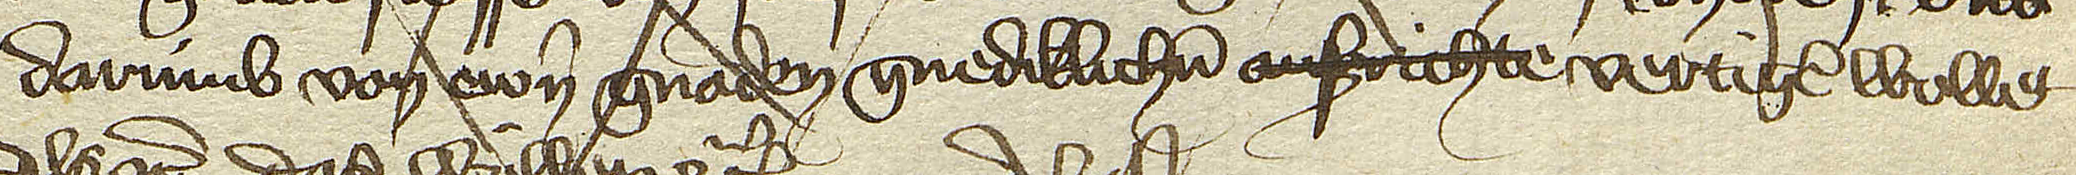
darümb von ew*n gnaden gnediklichn* auſʒrichte vertige* wollet
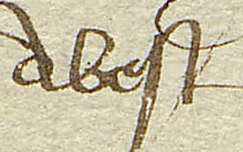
Abeſt
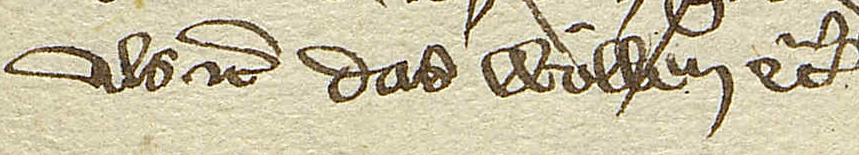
Als ec* das wöllen ec*
